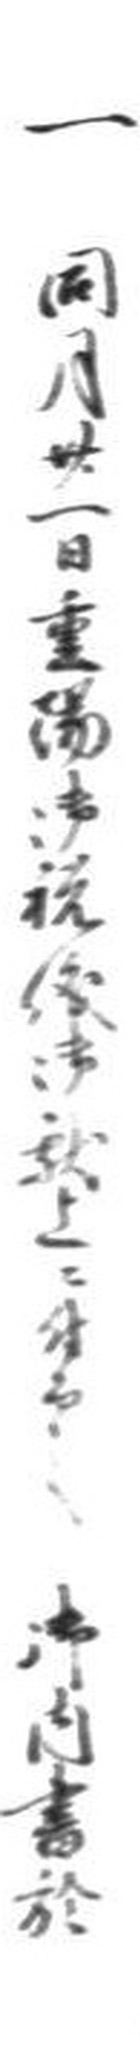一同月廿一日重陽御祝儀御献上ニ付而之御内書於
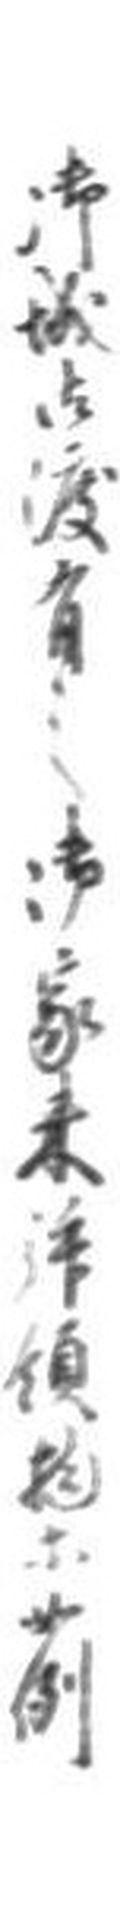御城御渡有之御家来拝領物等如例
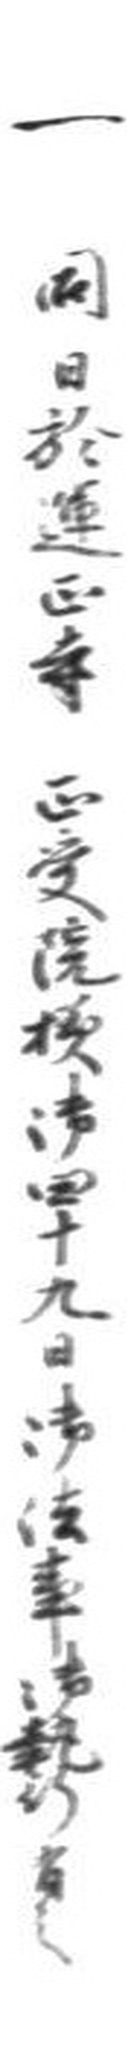一同日於運正寺正受院様御四十九日御法事御執行有之
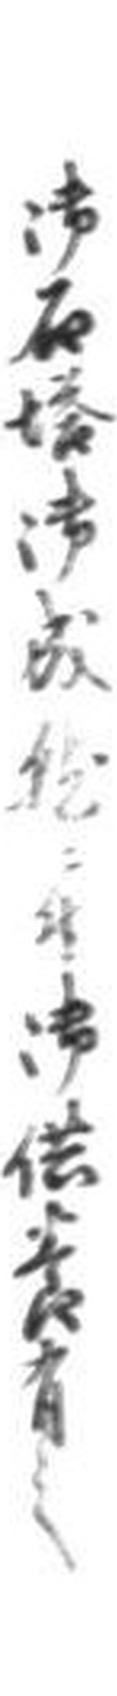御石塔御成就ニ付御供養有之
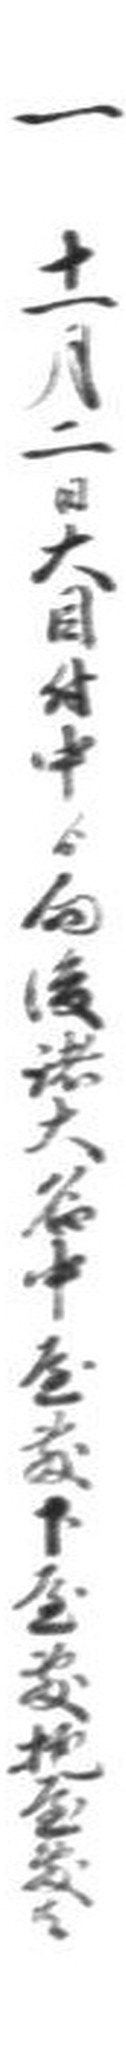一十一月二日大目付中ゟ向後諸大名中屋敷下屋敷抱屋敷共
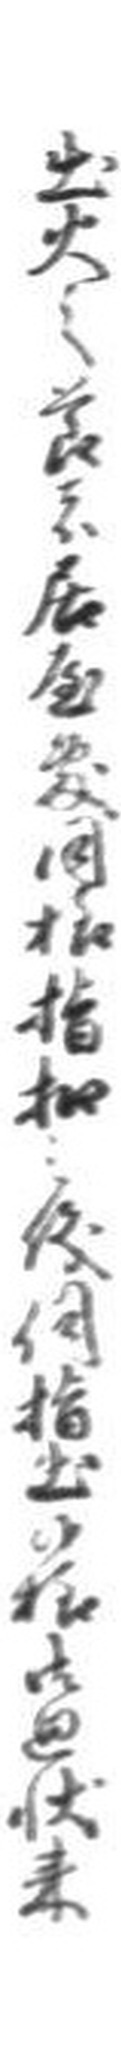出火之節者居屋敷同様指控之儀伺指出候様御廻状来

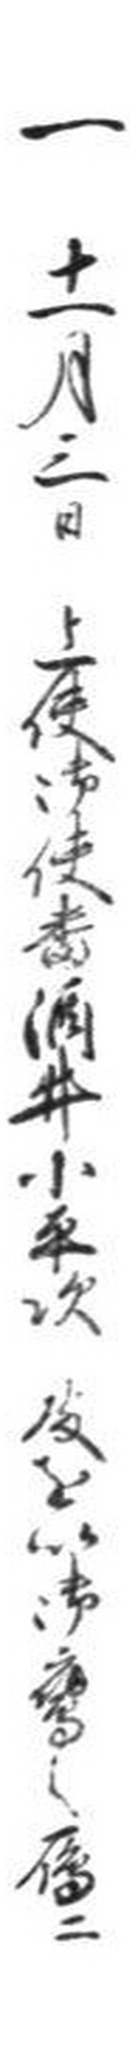一十一月三日上使御使者酒井小平次殿を以御鷹之鳫二
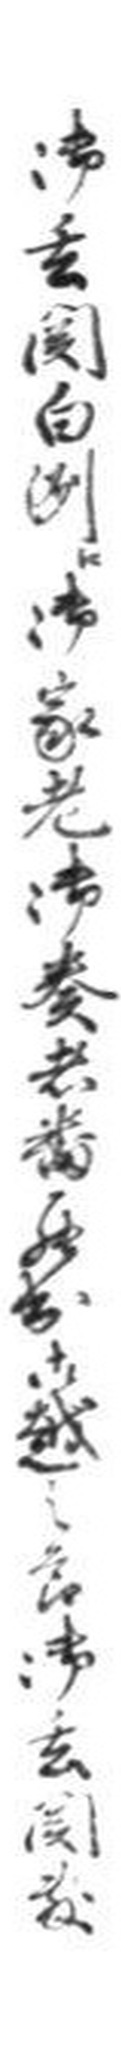御玄関白洲江御家老御奏者番罷出御越之節御玄関敷
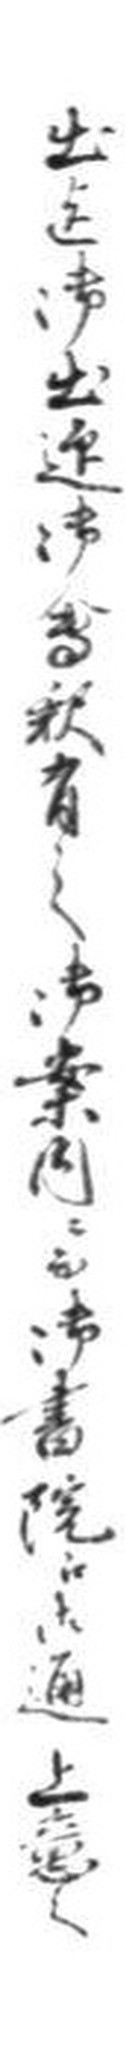出迄御出迎御会釈有之御案内ニ而御書院江御通上意之
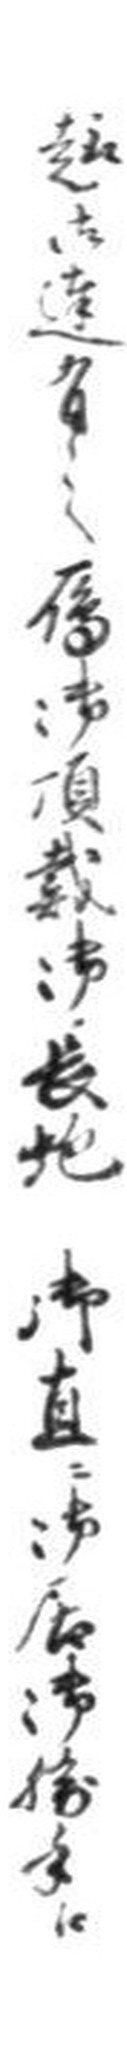趣御達有之鳫御頂戴御長蚫御直ニ御居勝手江
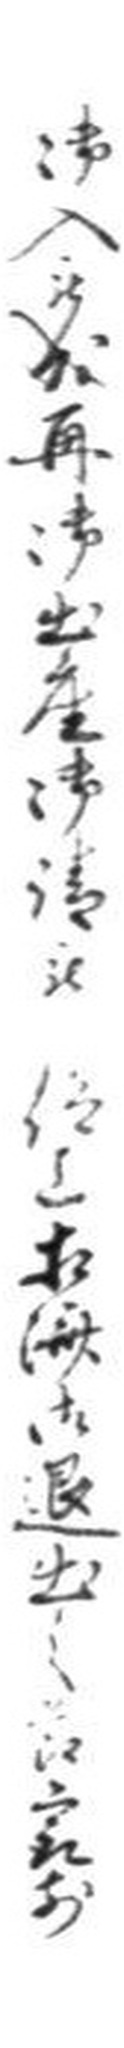御入被成再御出座御請被仰上相済御退出之節最前
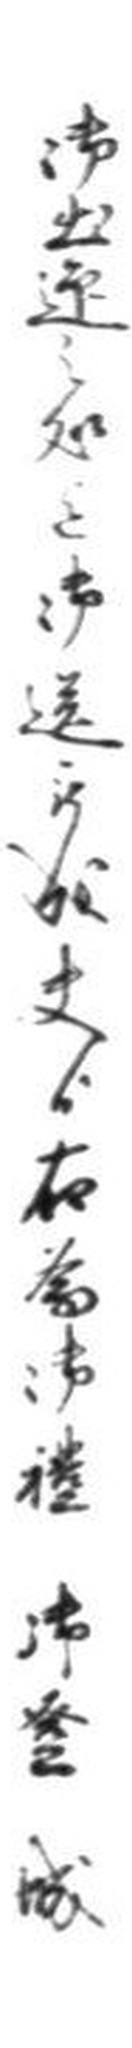御出迎之処迄御送被成夫ゟ右為御礼御登城
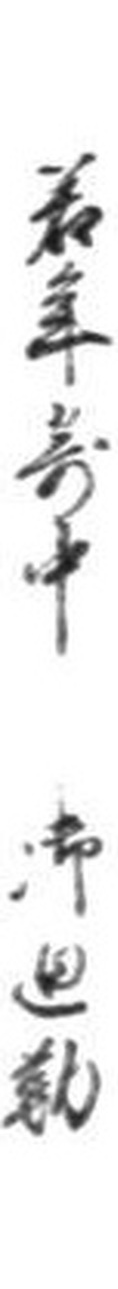若年寄中御廻勤
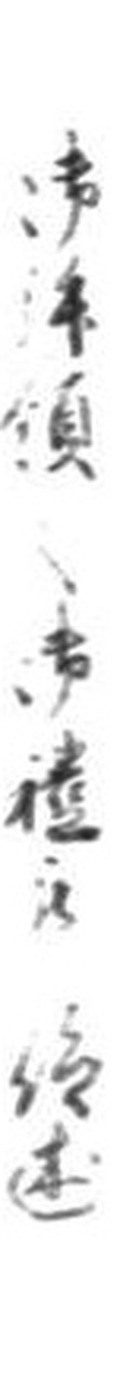御拝領之御礼被仰述
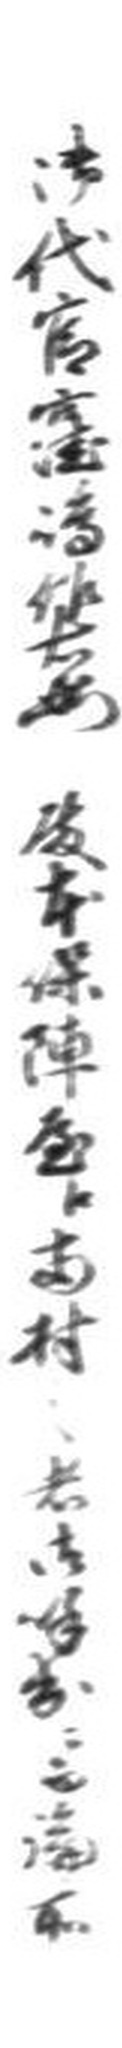御代官窪嶋作右衛門殿本保陣屋江両村之者御呼出ニ而論所
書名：家譜 三十六 宗昌公 従享保八年到同九年
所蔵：福井県文書館 Fukui Prefectural Archives
